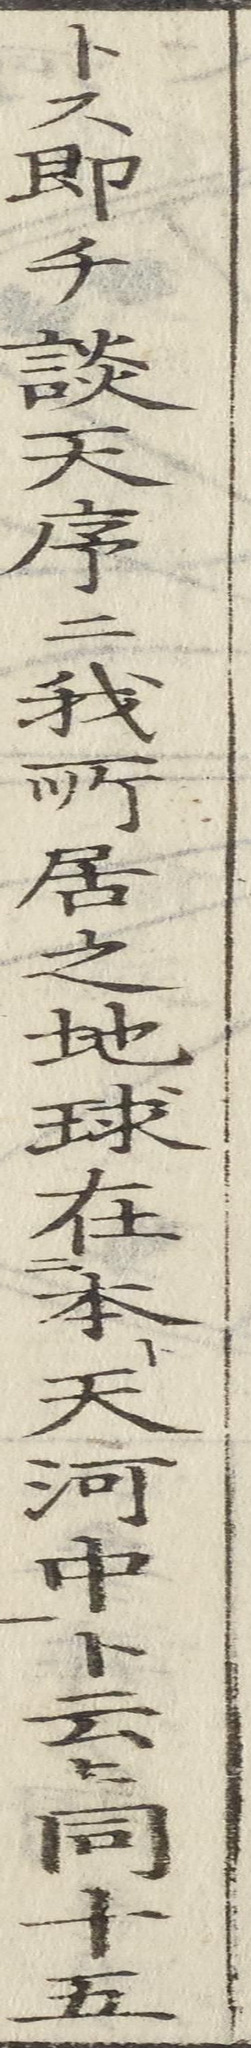トス即チ談天序ニ我所居之地球在ニ本天河中ト云ヒ同十五
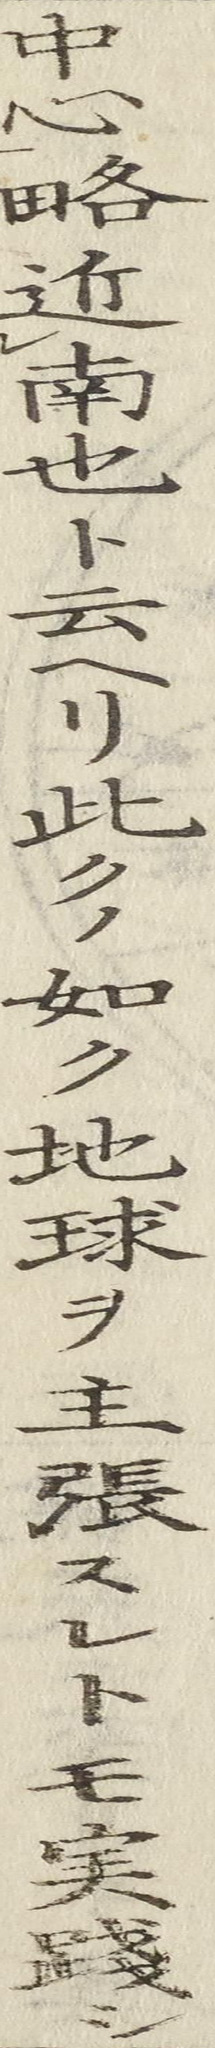中心略近南也ト云ヘリ此クノ如ク地球ヲ主張スレトモ実践シ
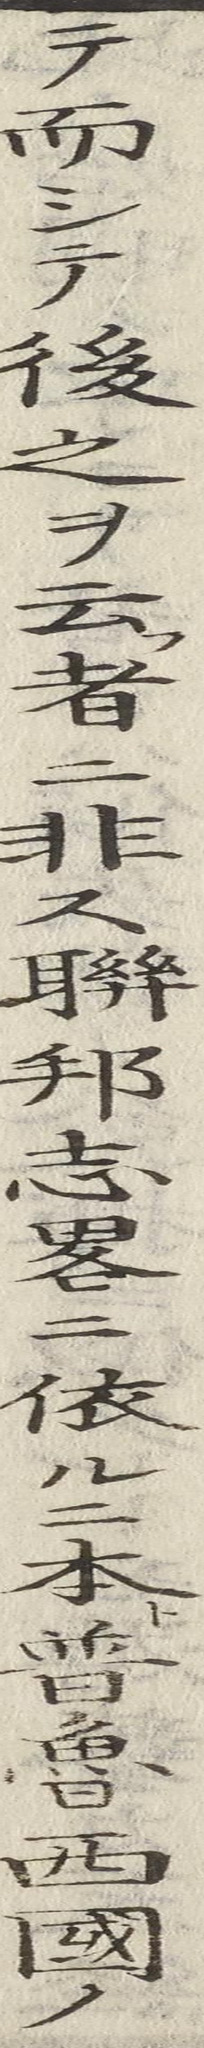テ而シテ後之ヲ云者ニ非ス聯邦志略ニ依ルニ本普魯西国ノ
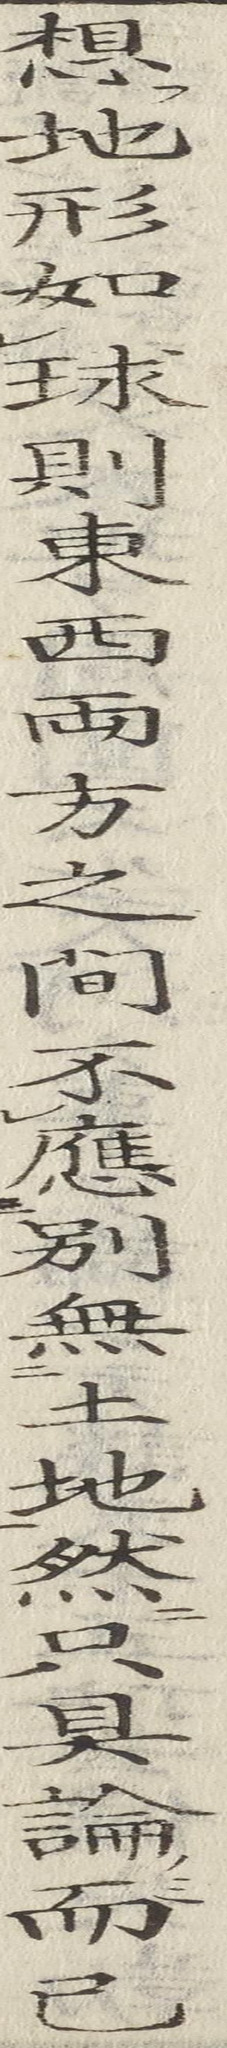想地形如球則東西両方之間不応別無ニ土地然只具論而已
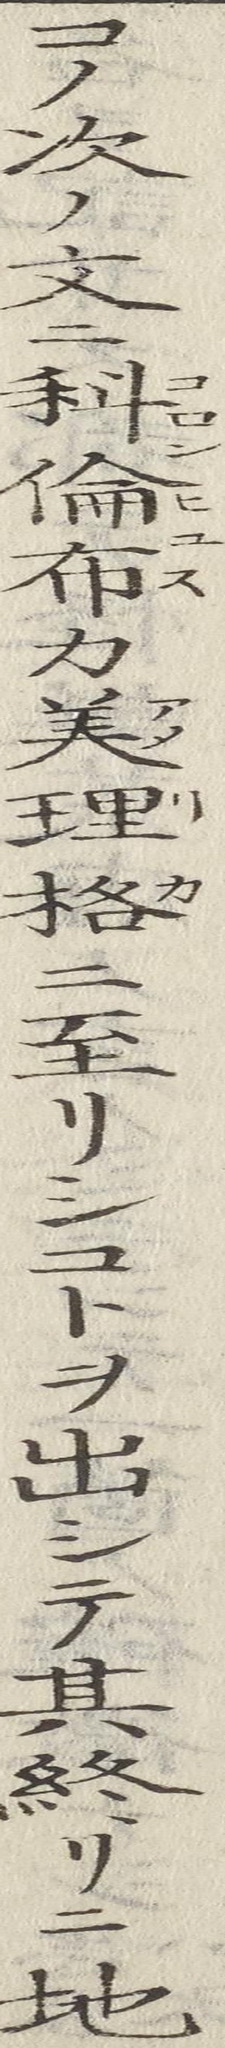コノ次ノ文ニ科倫布カ美理格ニ至リシコトヲ出シテ其終リニ地
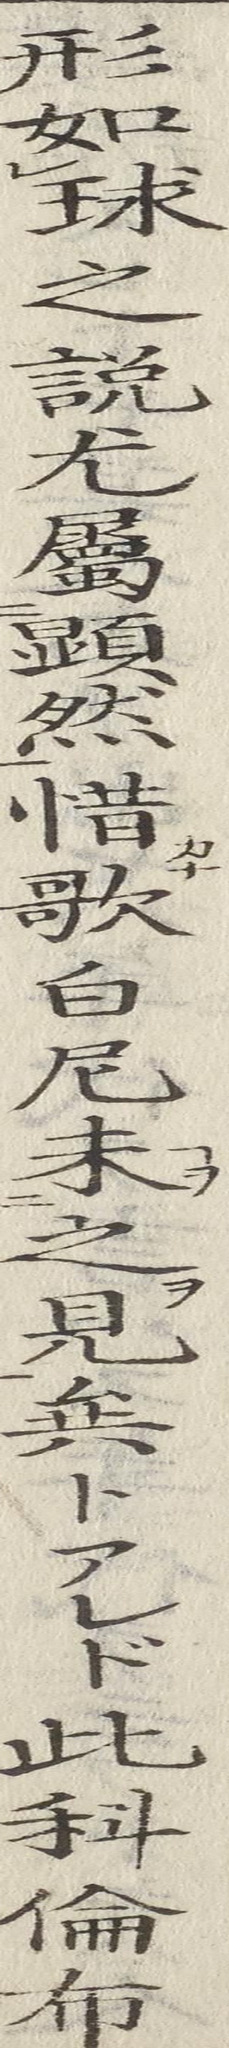形如球之説尤属ニ顕然惜歌白尼末ニ之見ム共トアレド此科倫布
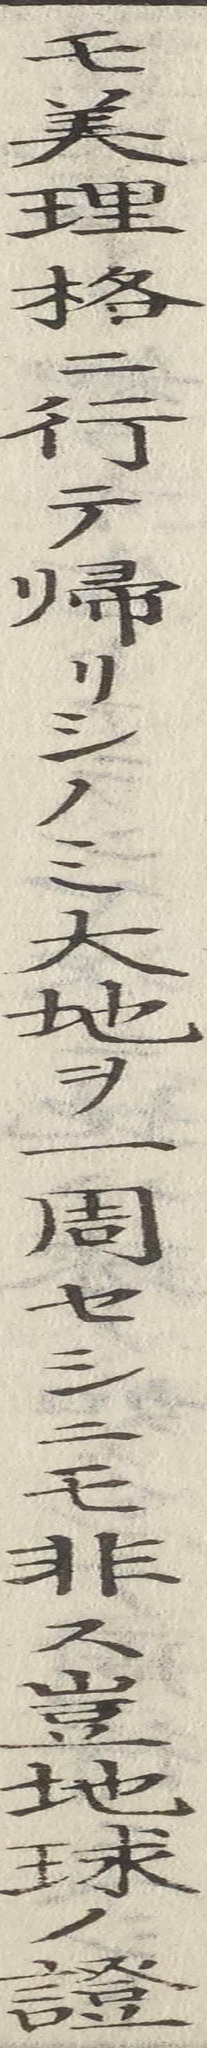モ美理格ニ行テ帰リシノミ大地ヲ一周セシニモ非ス豈地球ノ證
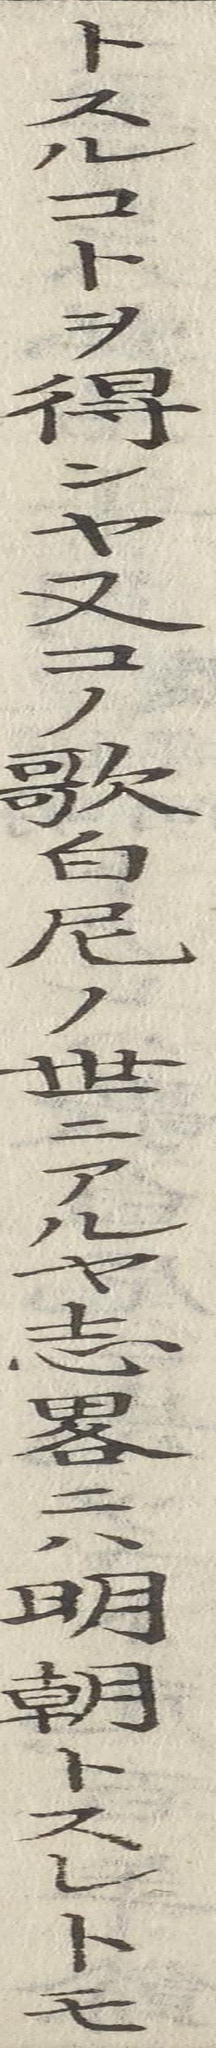トスルコトヲ得ンヤ又コノ歌白尼ノ世ニアルヤ志略ニハ明朝トスレトモ

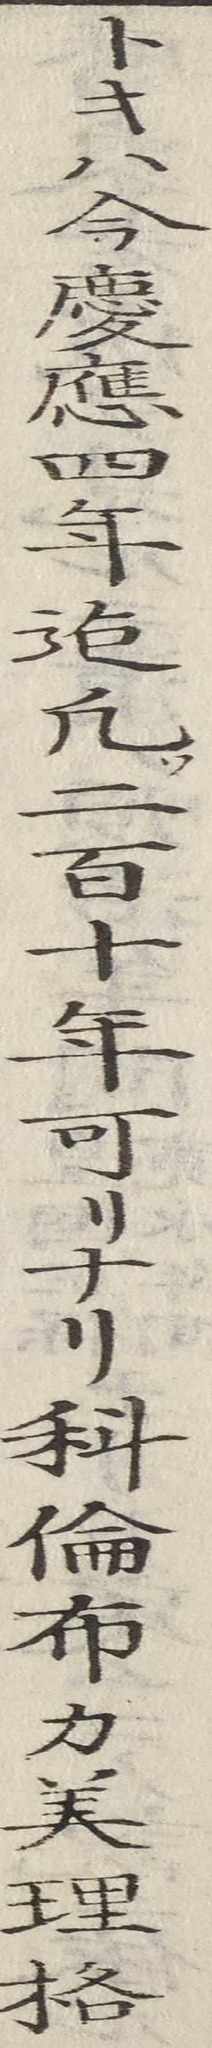トキハ今慶応四年迄凡二百十年可リナリ科倫布カ美理格
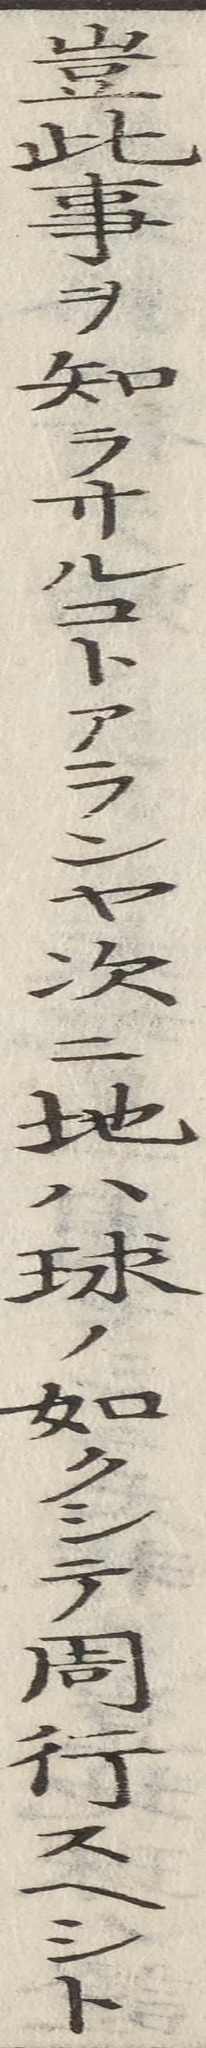豈此事ヲ知ラサルコトアランヤ次ニ地ハ球ノ如クシテ周行スヘシト
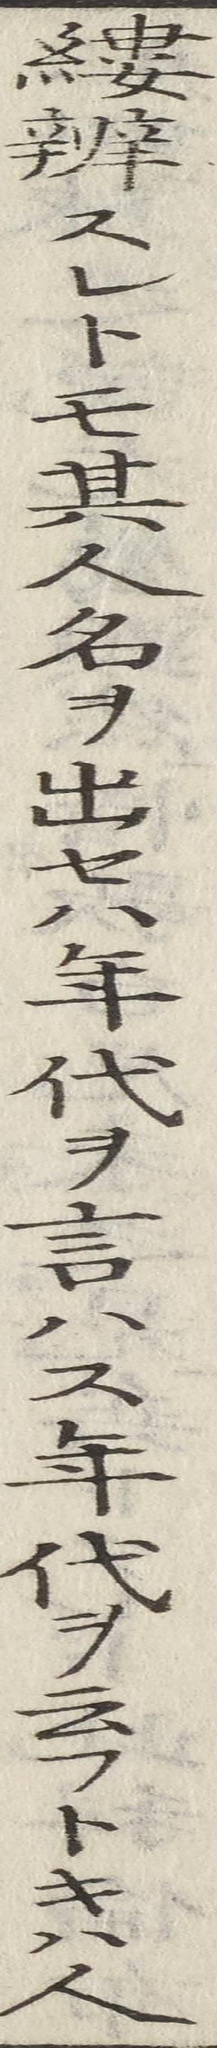縷弁スレトモ其人名ヲ出セハ年代ヲ言ハス年代ヲ云フトキハ人
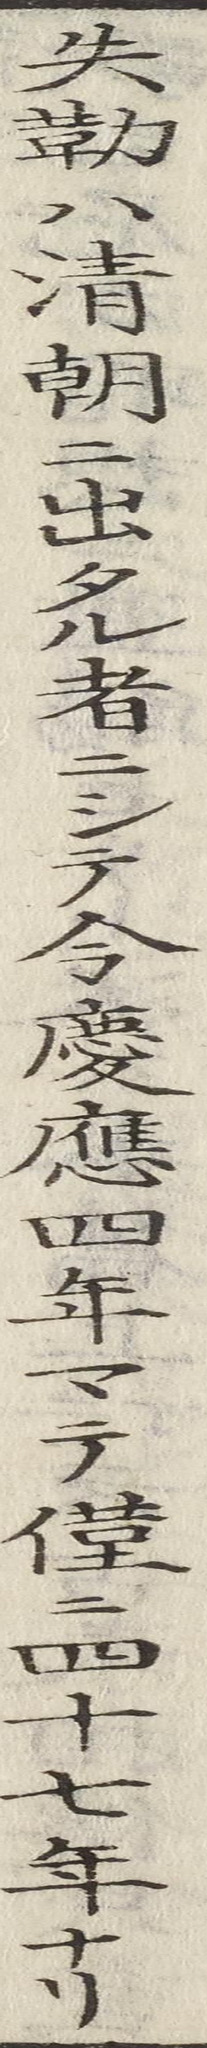失勒ハ清朝ニ出タル者ニシテ今慶応四年マテ僅ニ四十七年ナリ
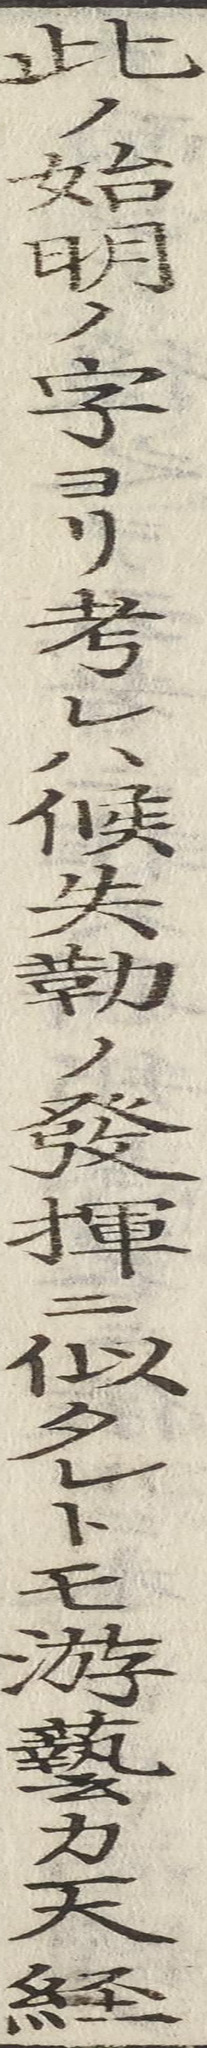此ノ始明ノ字ヨリ考レハ候失勒ノ発揮ニ似タレトモ游芸カ天経
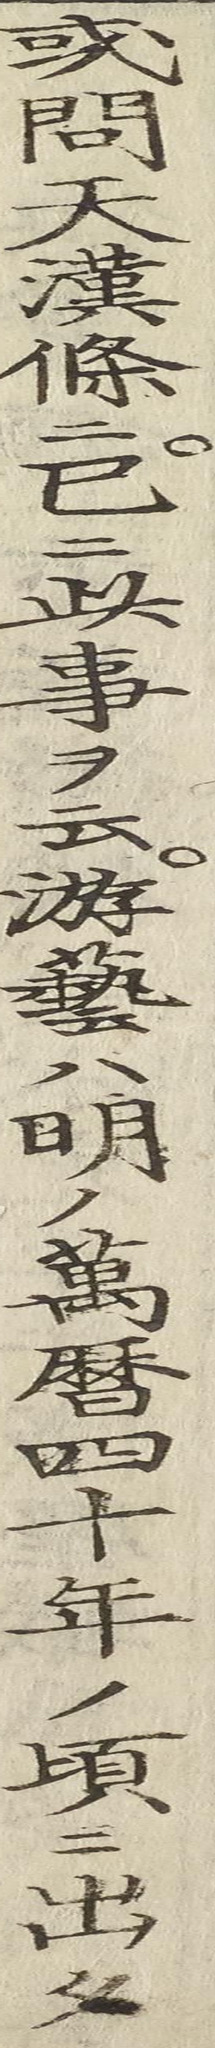或問天漢条ニ。已ニ興事ヲ云。游芸ハ明ノ万暦四十年ノ頃ニ出タ
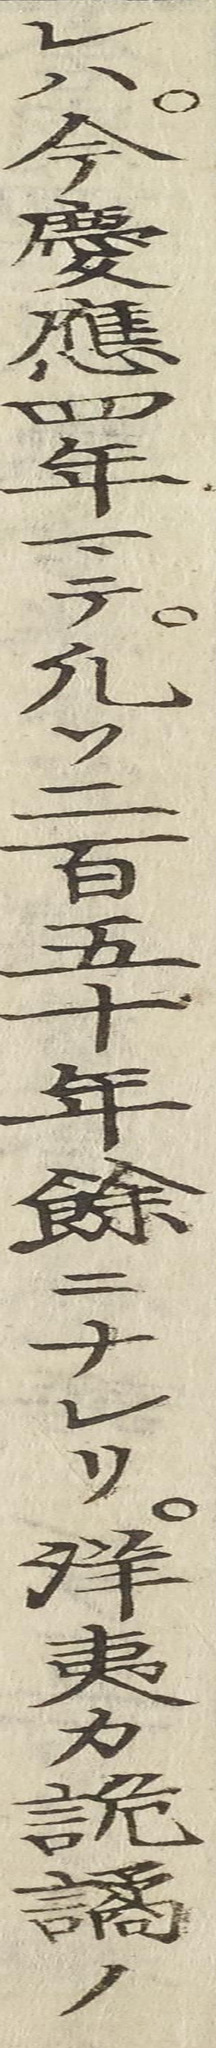レハ。今慶応四年マテ。凡ソ二百五十年余ニナレリ。洋夷カ詭譎ノ
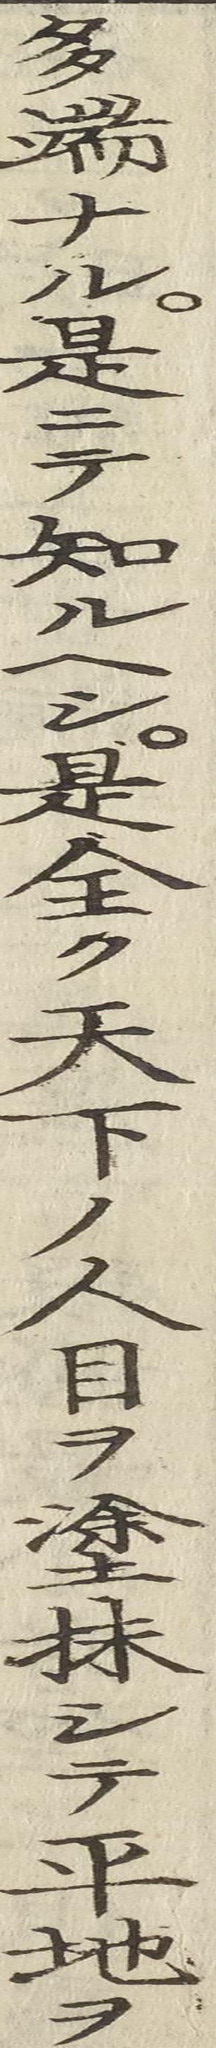多端ナル。是ニテ知ルヘシ。是全ク天下ノ人目ヲ塗抹シテ平地ヲ
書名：護法新論　二編　中
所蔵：東京大学地震研究所図書室 Earthquake Research Institute Library, The University of Tokyo, JAPAN
